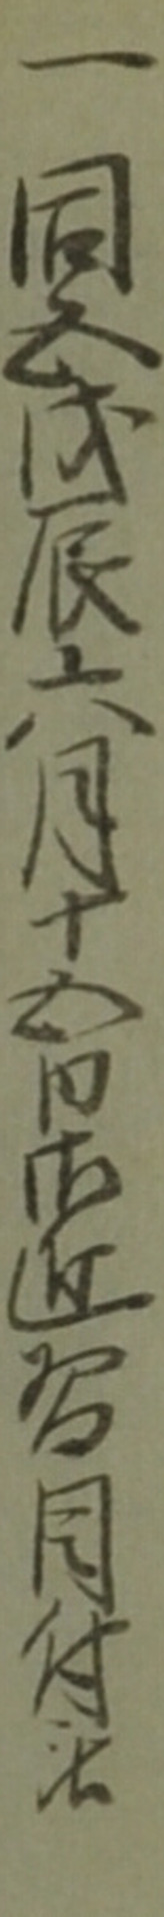一同五戊辰六月十五日御近習目付被
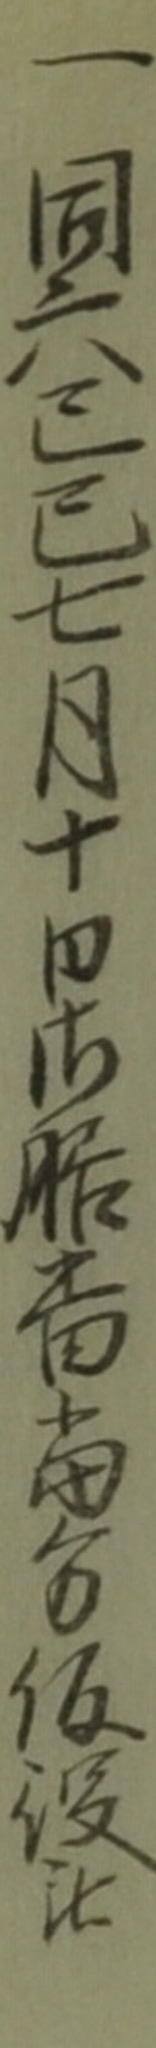一同六己巳七月十日御膳番当分仮役被
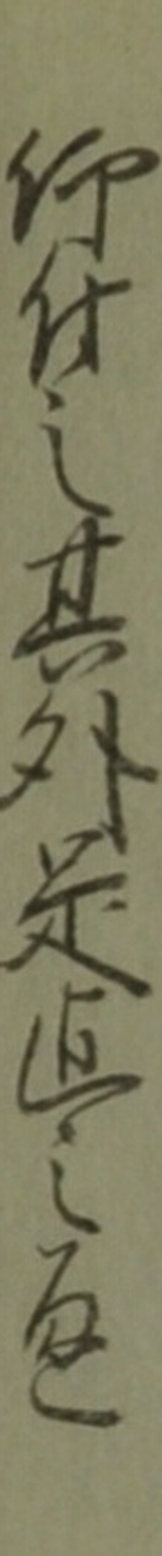仰付之其外是迄之通
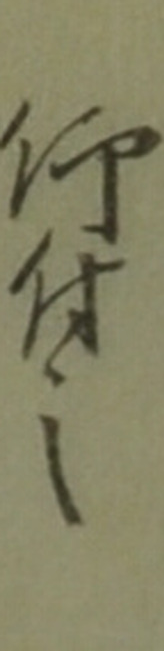仰付之
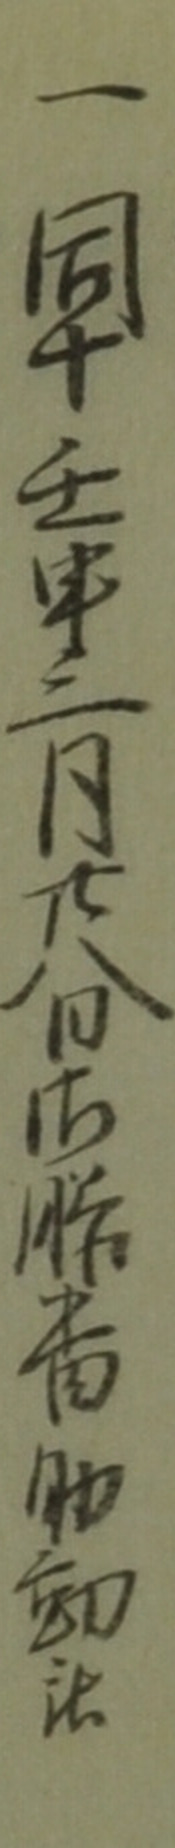一同十壬申三月廿八日御膳番助勤被
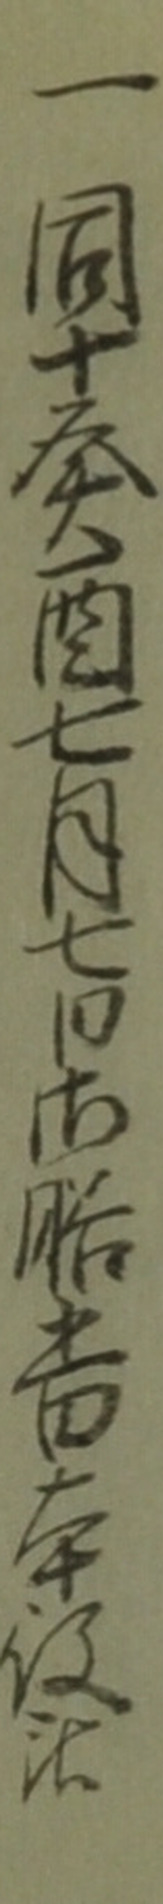一同十癸酉七月七日御膳番本役被
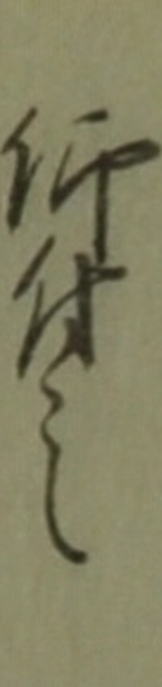仰付之
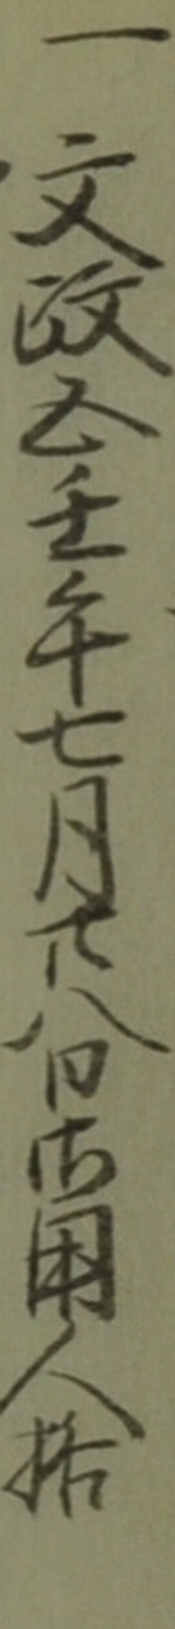一文政五壬午七月廿八日御用人格
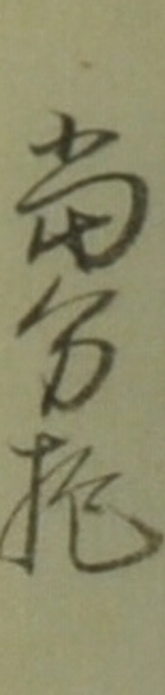当分抱
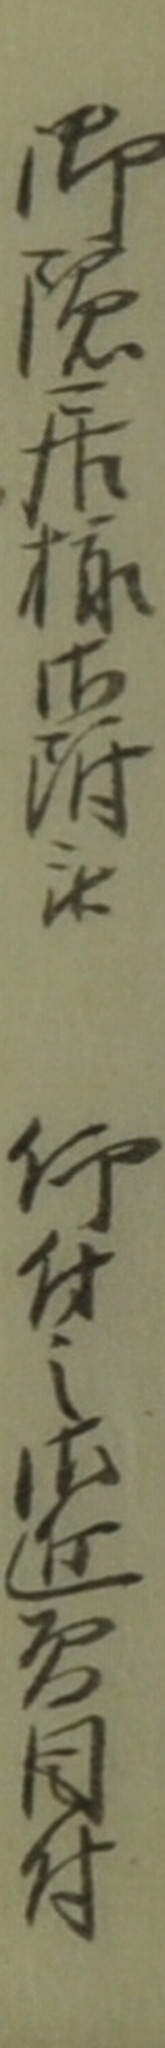御隠居様御附被仰付之御近習目付
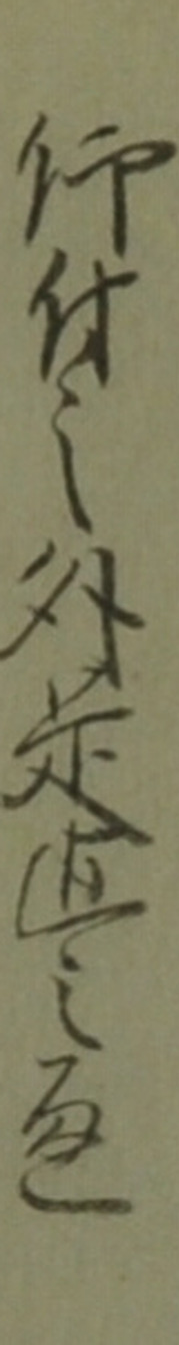仰付之外是迄之通

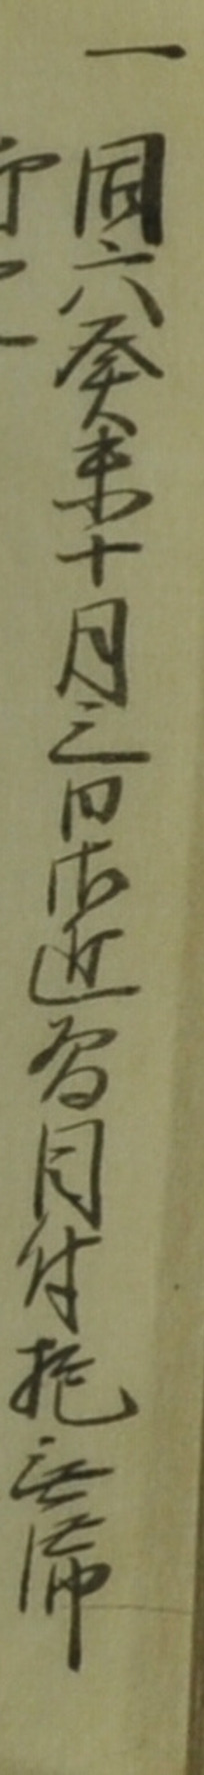一同六癸未十月三日御近習目付抱無滞
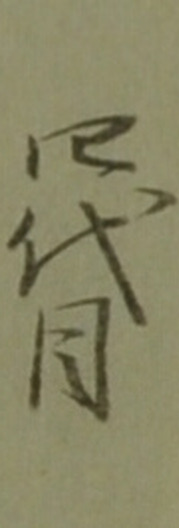四代目
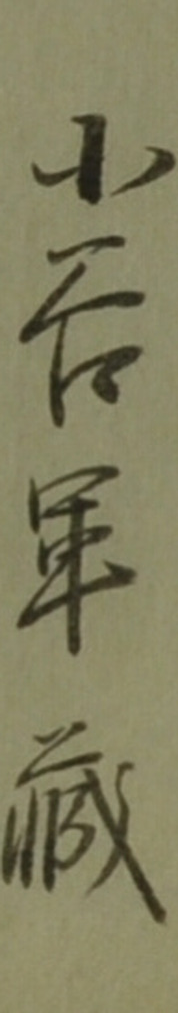小谷軍蔵
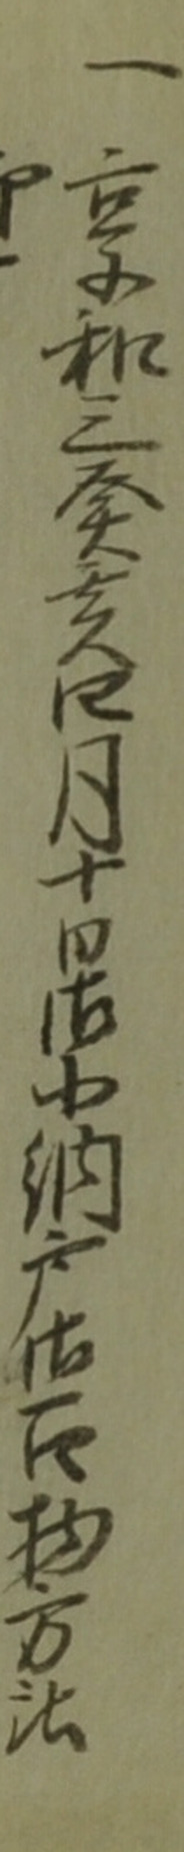一享和三癸亥四月十日御小納戸御召物方被
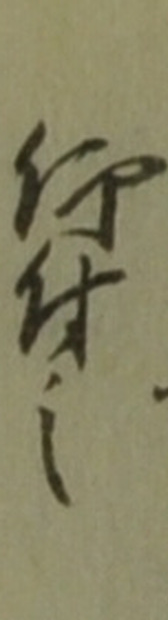仰付之
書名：諸御役代々録（五）
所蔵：伊那市立高遠町図書館・合同会社AMANE
